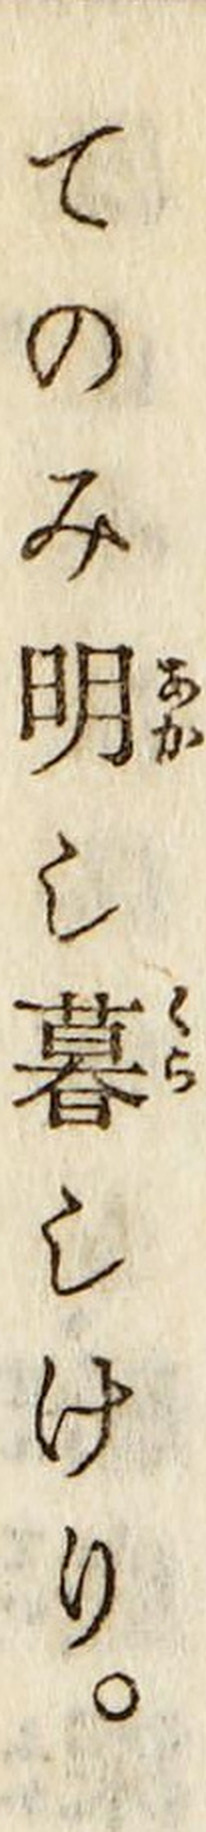てのみ明し暮しけり。
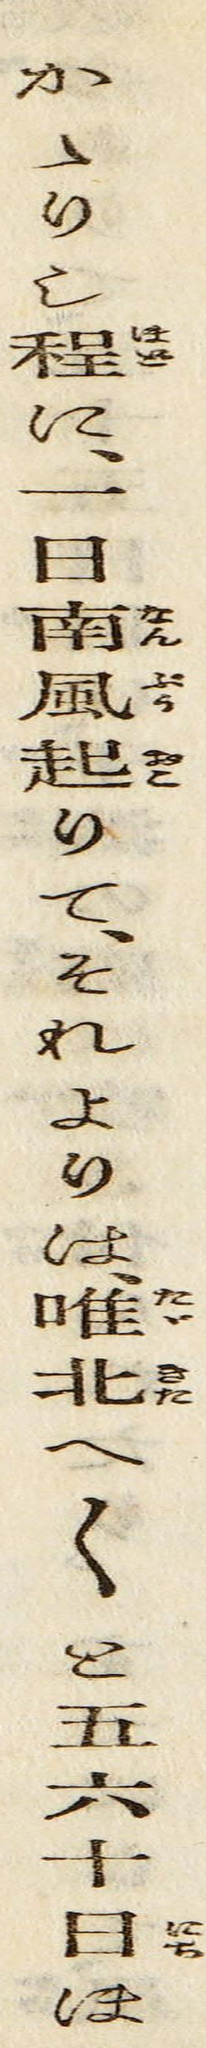かゝりし程に、一日南風起りて、それよりは、唯北へ〳〵と五六十日ほ
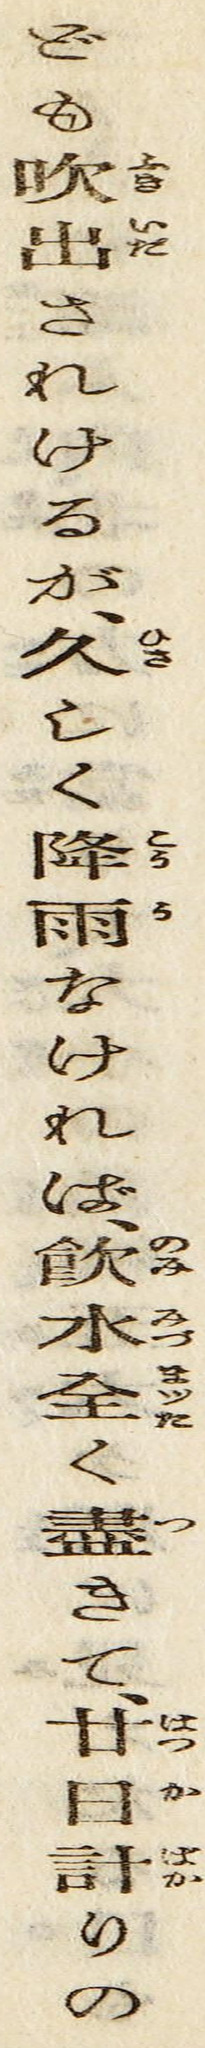ども吹出されけるが、久しく降雨なければ、飲水全く尽きて、廿日計りの
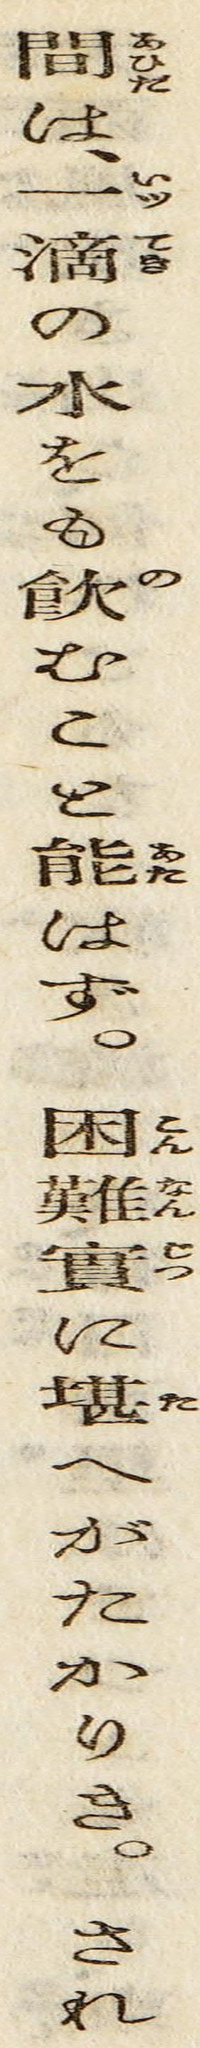間は、一滴の水をも飲むこと能はず。困難実に堪へがたかりき。され
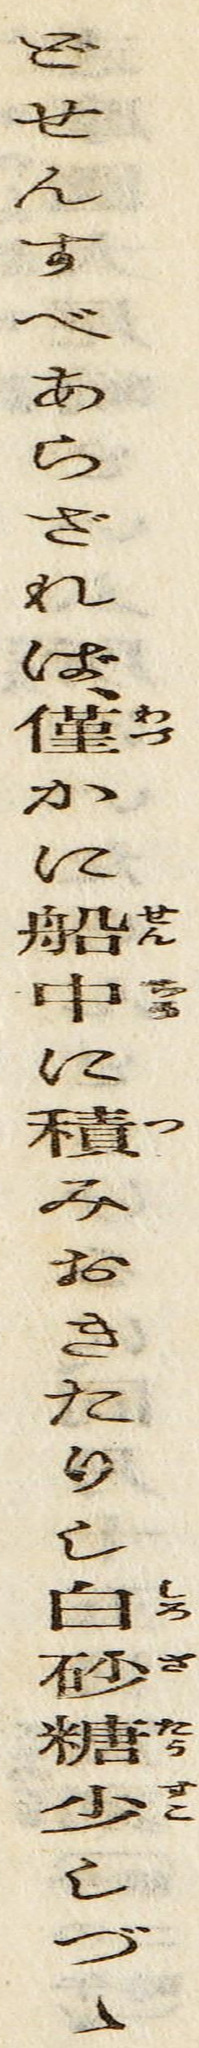どせんすべあらざれば、僅かに船中に積みおきたりし白砂糖少しづゝ
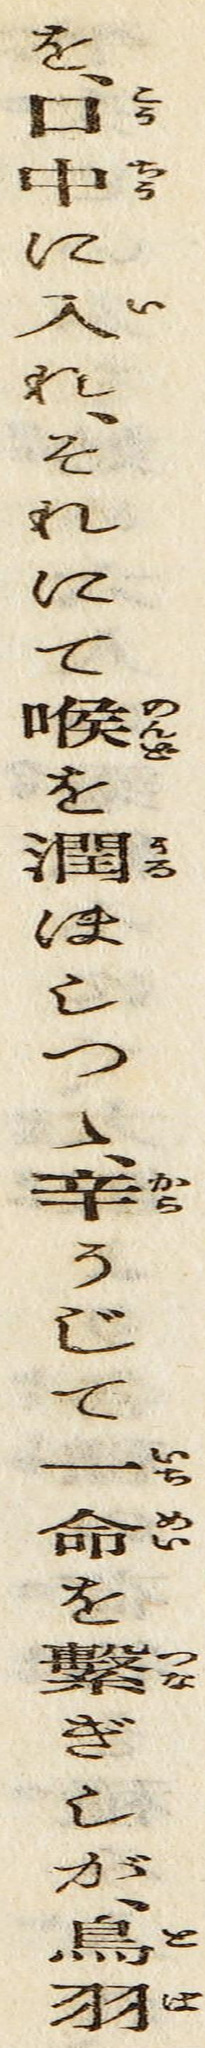を、口中に入れ、それにて喉を潤ほしつゝ、辛うじて一命を繋ぎしが、鳥羽
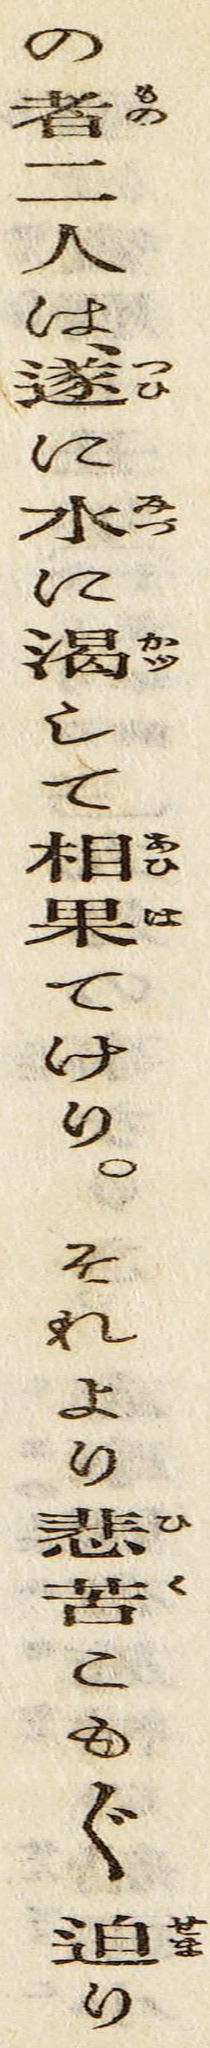の者二人は、遂に水に渇して相果てけり。それより悲苦こも〴〵迫り
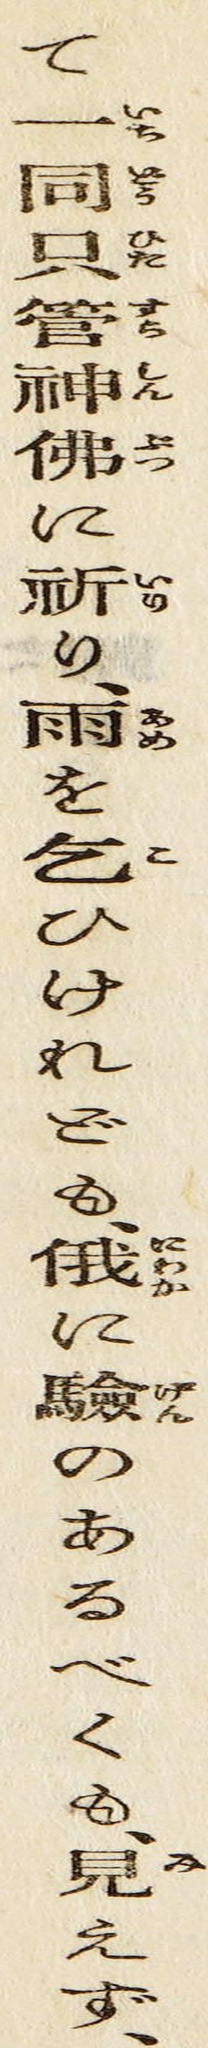て一同只管神仏に祈り、雨を乞ひけれども、俄に験のあるべくも、見えず、
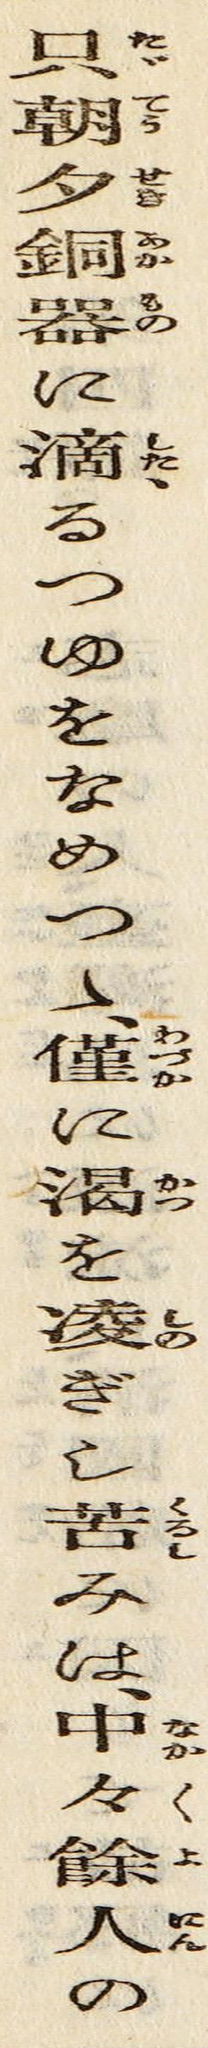只朝夕銅器に滴るつゆをなめつゝ、僅に渇を凌ぎし苦みは、中々余人の
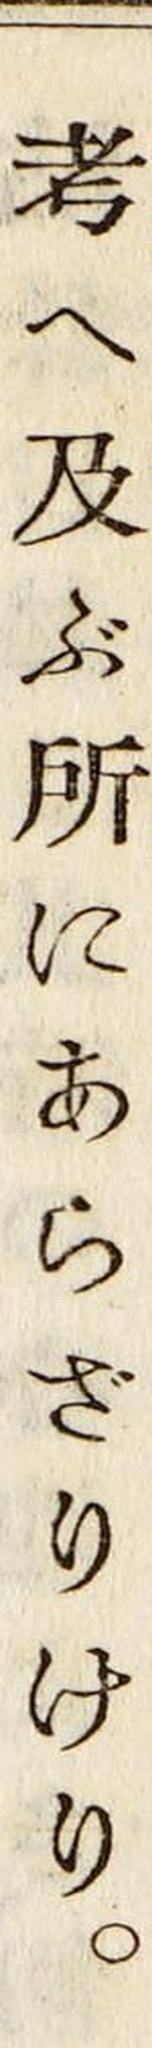考へ及ぶ所にあらざりけり。
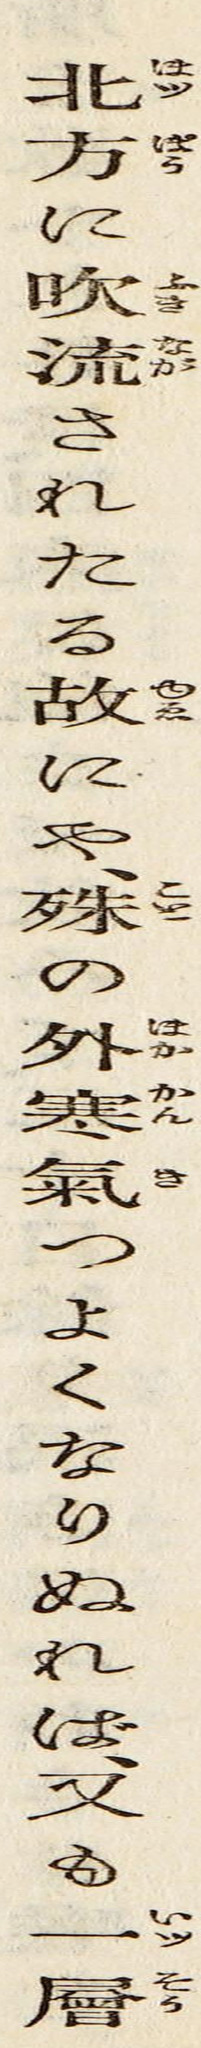北方に吹流されたる故にや、殊の外寒気つよくなりぬれば、又も一層
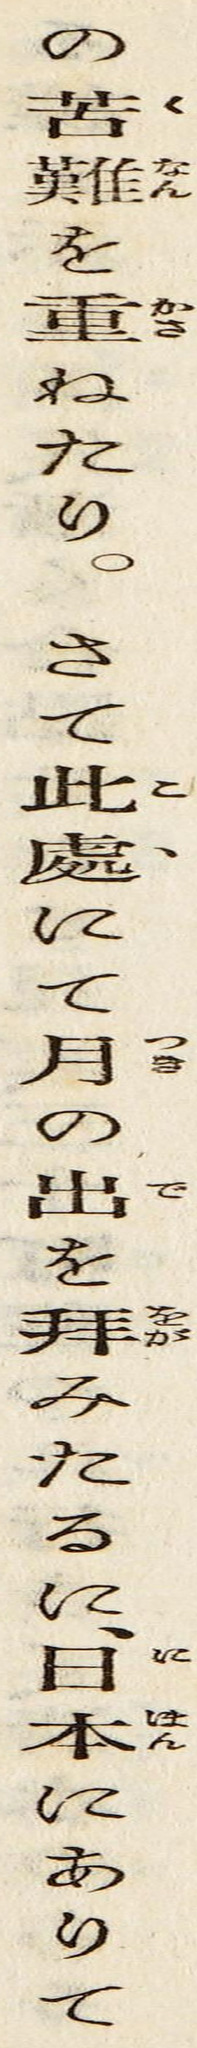の苦難を重ねたり。さて此処にて月の出を拝みたるに、日本にありて
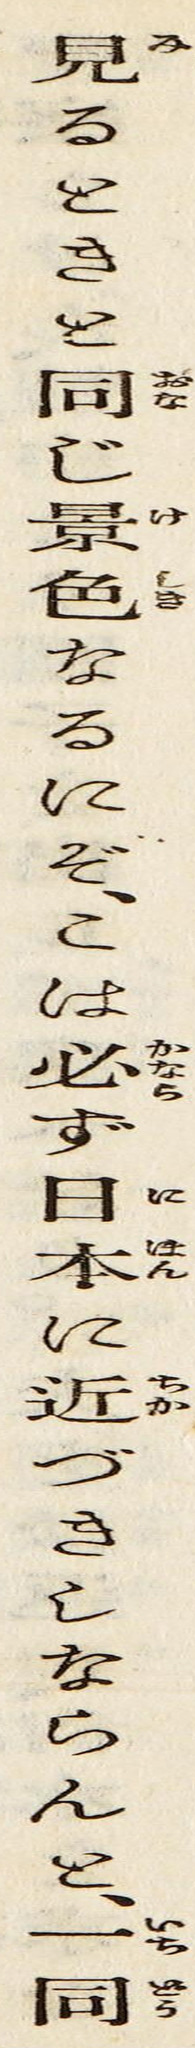見るときと同じ景色なるにぞ、こは必ず日本に近づきしならんと、一同
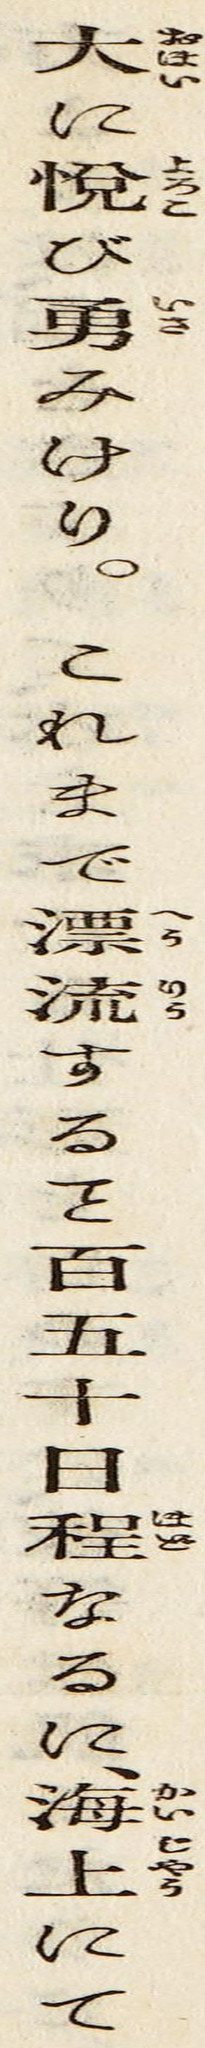大に悦び勇みけり。これまで漂流すること百五十日程なるに、海上にて
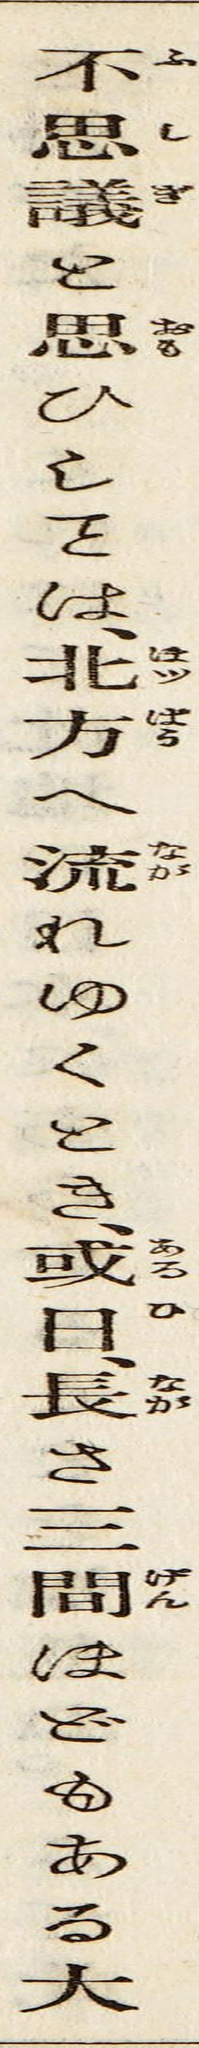不思議と思ひしことは、北方へ流れゆくとき、或日、長さ三間ほどもある大
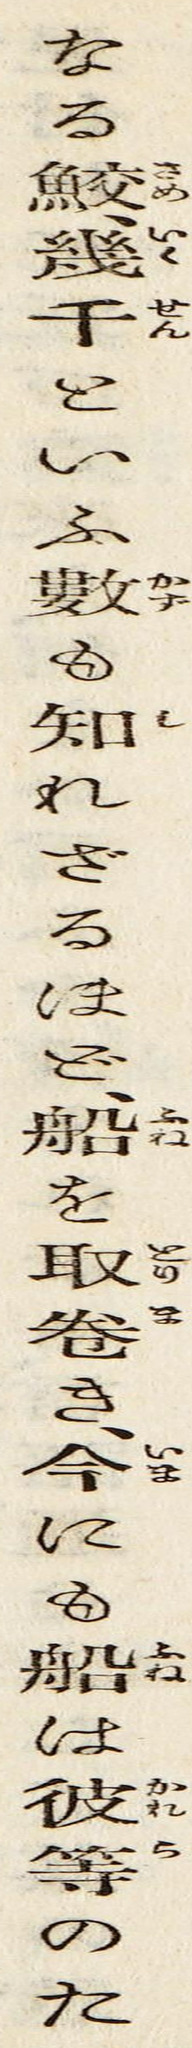なる鮫、幾千といふ数も知れざるほど、船を取巻き、今にも船は彼等のた
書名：日本漂流譚
